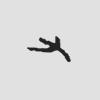又
